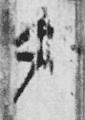内（入）
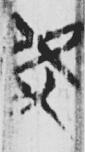𡚦（焉）
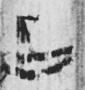㠯（以）
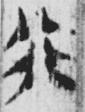行
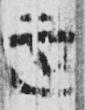正（政）
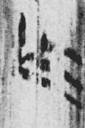於
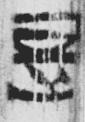是
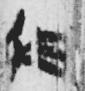於（乎）
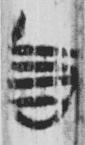○（治）
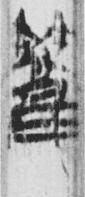○（爵）
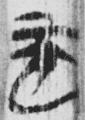而
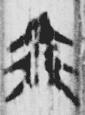行
